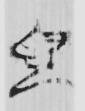見
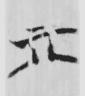亓
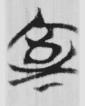室
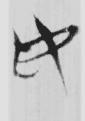女
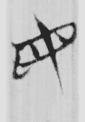母
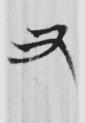又
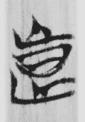良
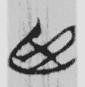臣
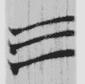三
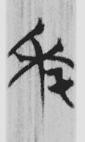年
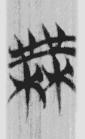無
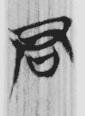君
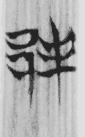邦
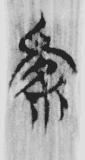{爪家}
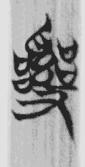{𤔔㗊}
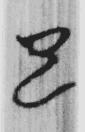巳
